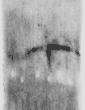七
